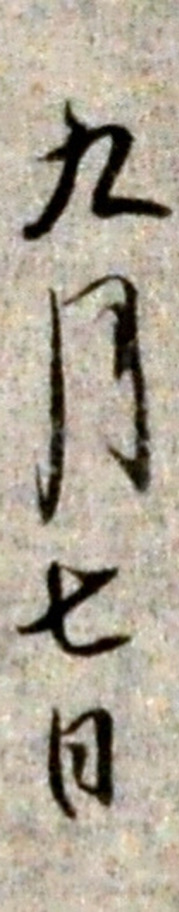九月七日
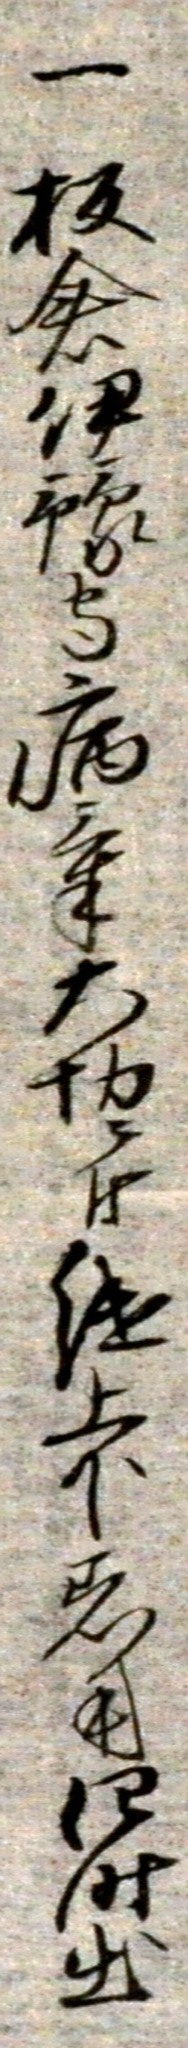一板倉伊豫守病気大切ニ付継上下着用四時出
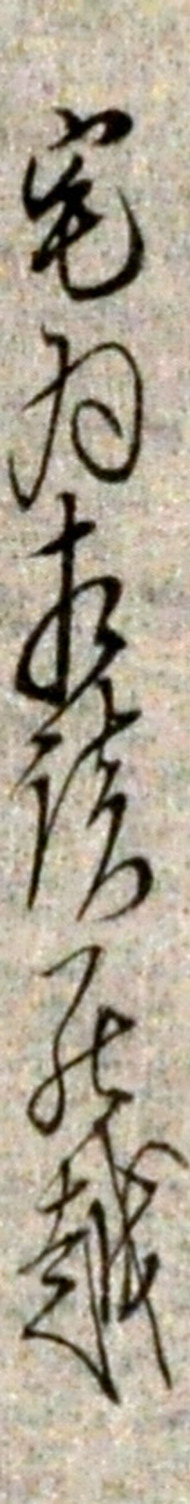宅為相談罷越
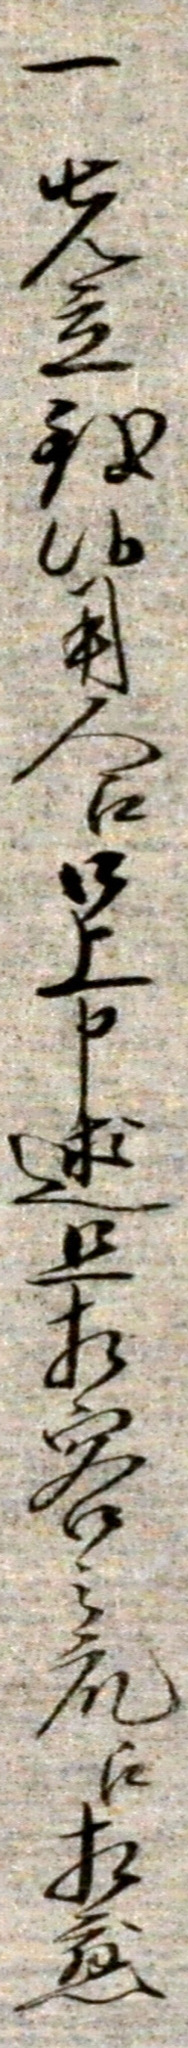一先立致候用人え口上申述且相客之衆え相応
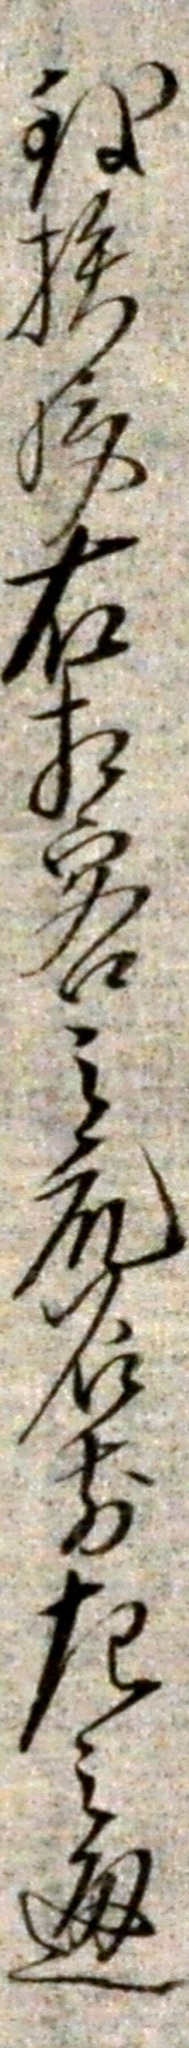致挨拶右相客之衆名前左之通
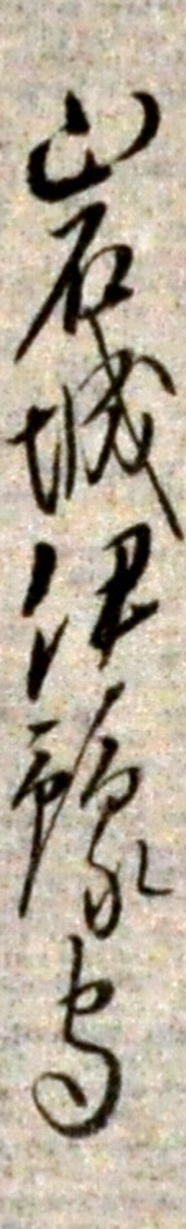岩城伊豫守
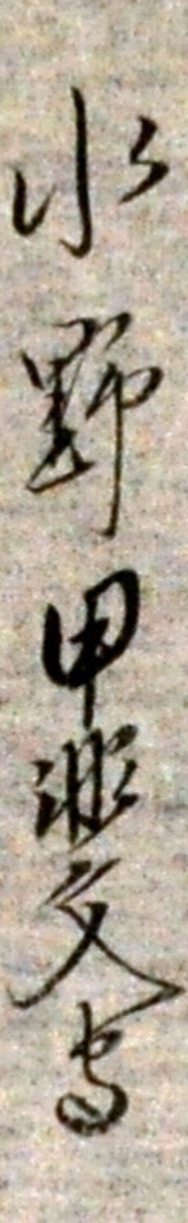水野甲斐守
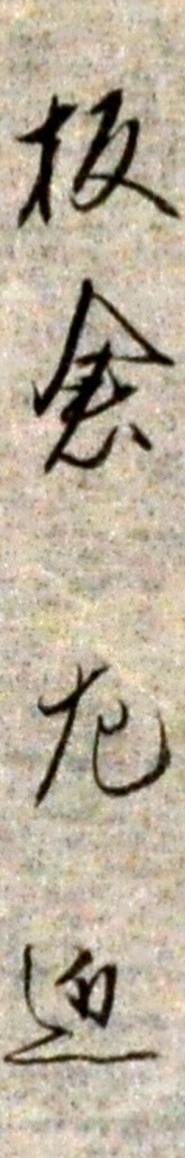板倉左近
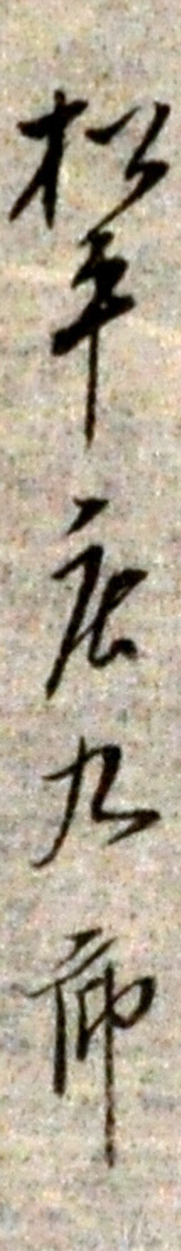松平庄九郎
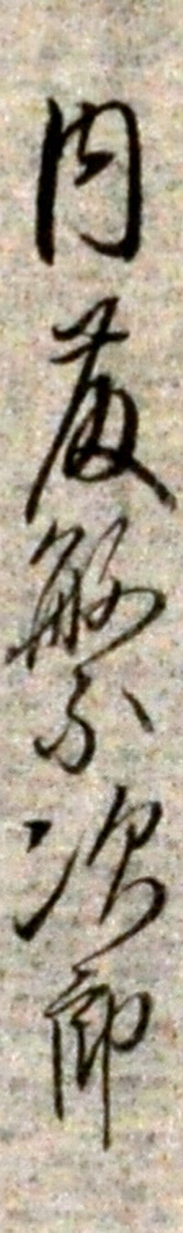内藤繁次郎
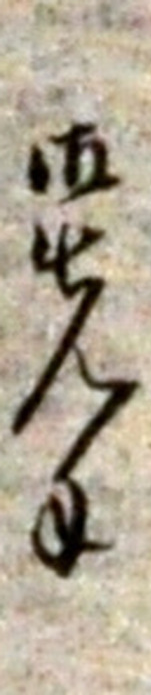御先手
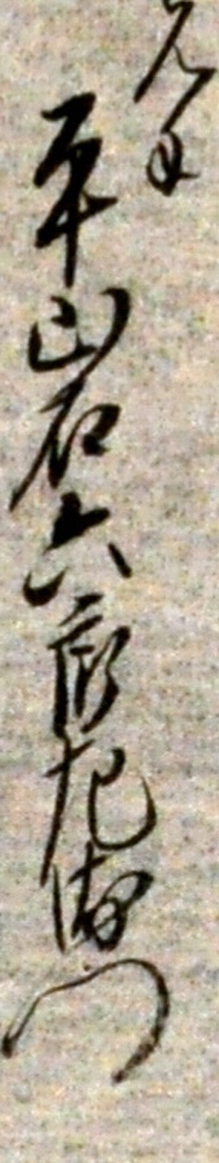平岩六郎左衛門
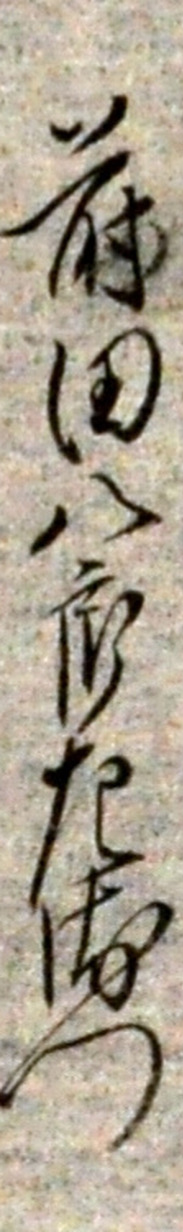蒔田八郎左衛門

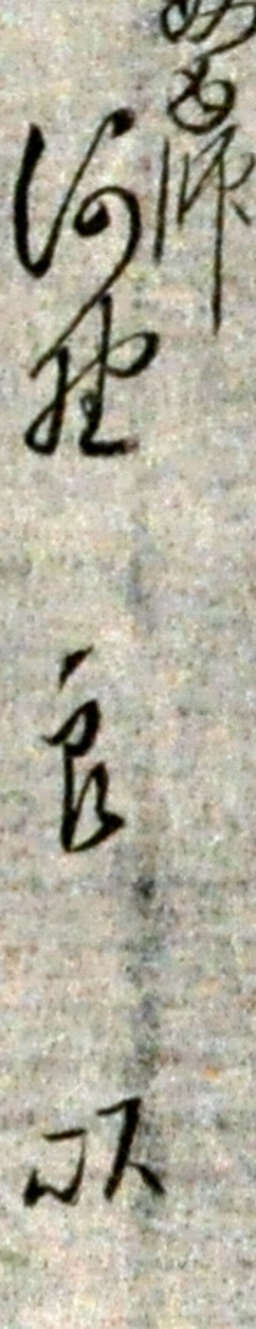河野良以
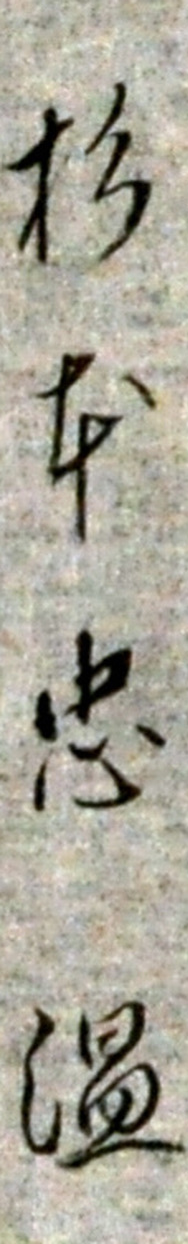杉本忠温
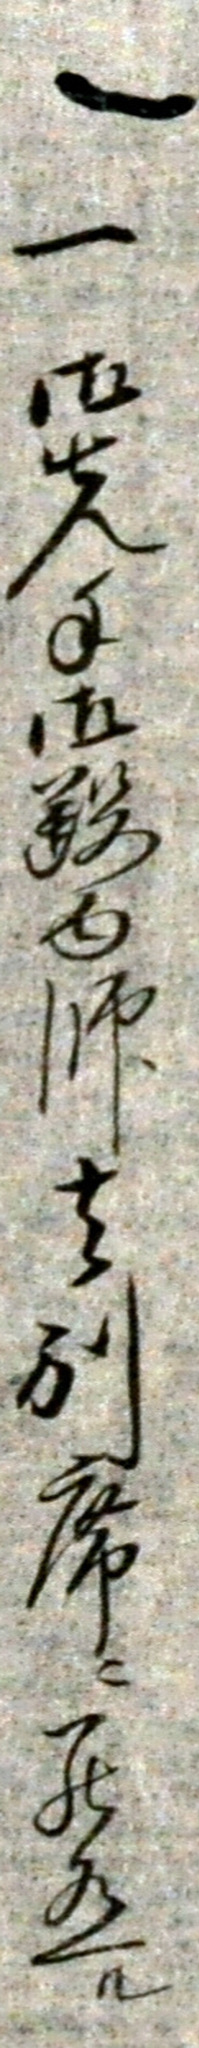一御先手御醫師は別席ニ罷有ル
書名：諸名代相勤候節ノ留書外
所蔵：伊那市立高遠町図書館・合同会社AMANE
